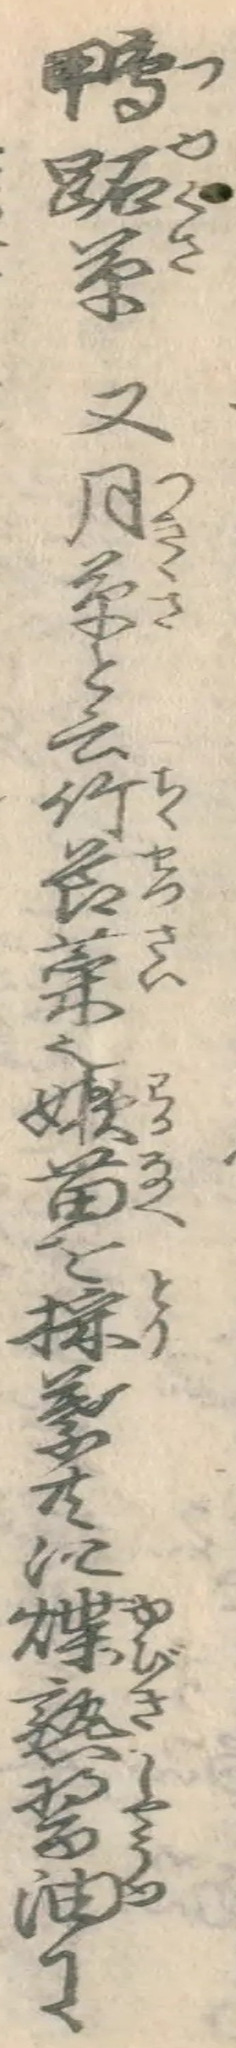鴨跖草又月草と云竹節菜也嫰苗を採葉共に煠熟醤油に
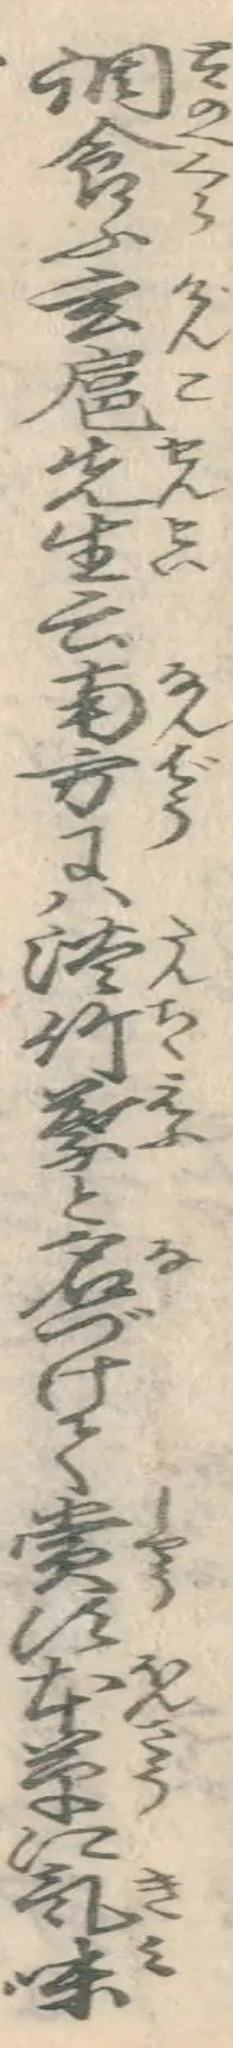調食ふ玄扈先生云南方には淡竹葉と名づけて賞す本草に気味
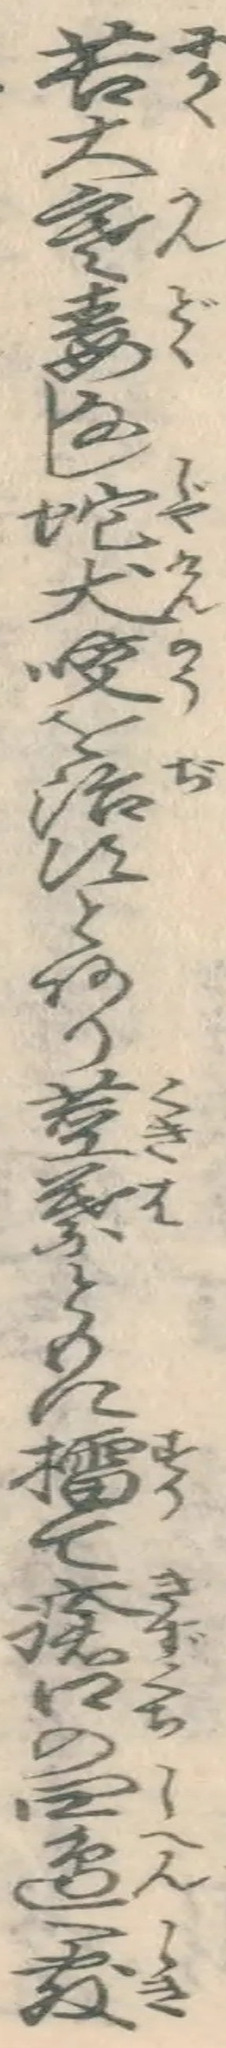苦大寒毒なし蛇犬咬を治すとあり茎葉ともに擂て瘡口の四辺敷
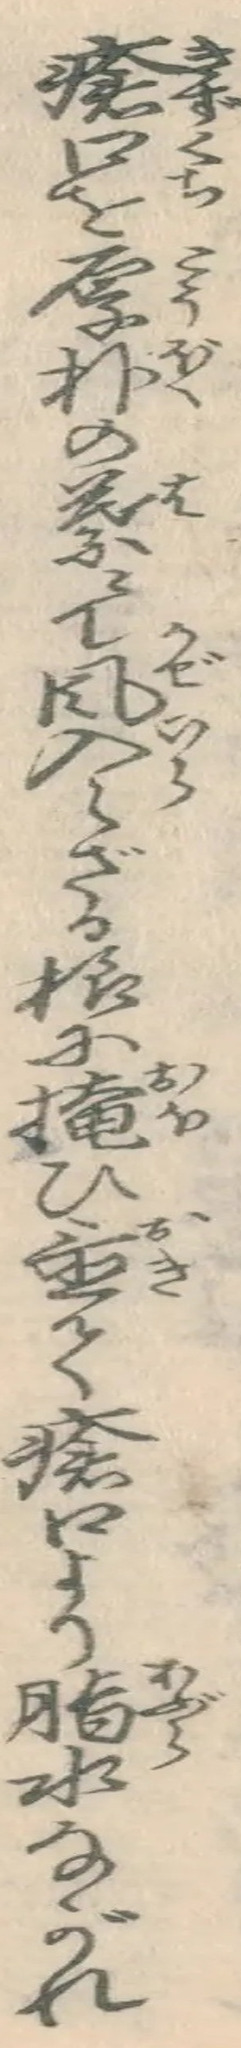瘡口を厚朴の葉にて風入らざる様に掩ひ置て瘡口より脂水ながれ
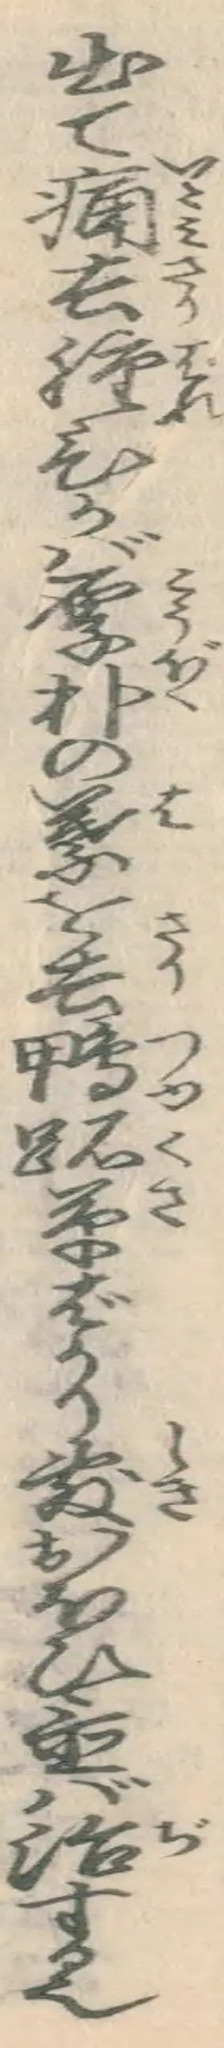出て痛去腫ひかば厚朴の葉を去鴨跖草ばかり敷おほひ置ば治する也
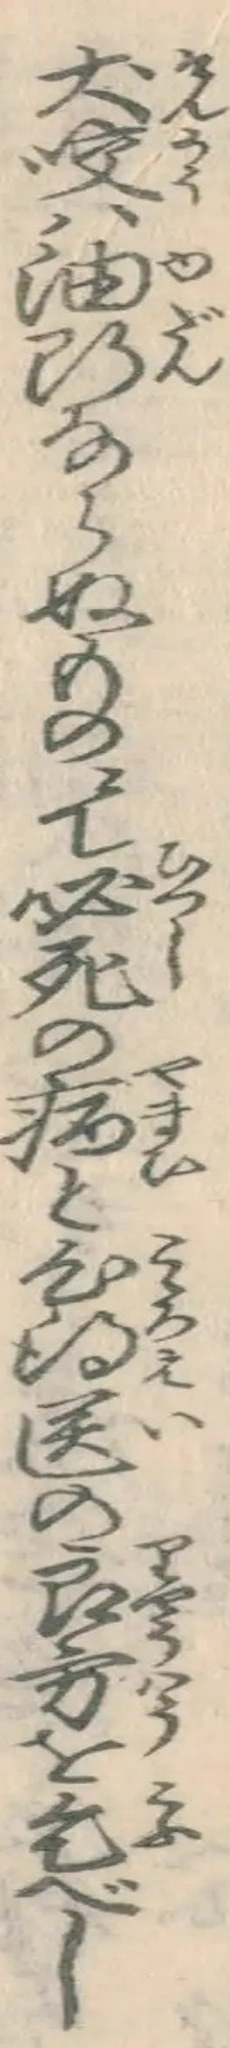犬咬は油断ならぬものにて必死の病と心得医の良方を乞べし
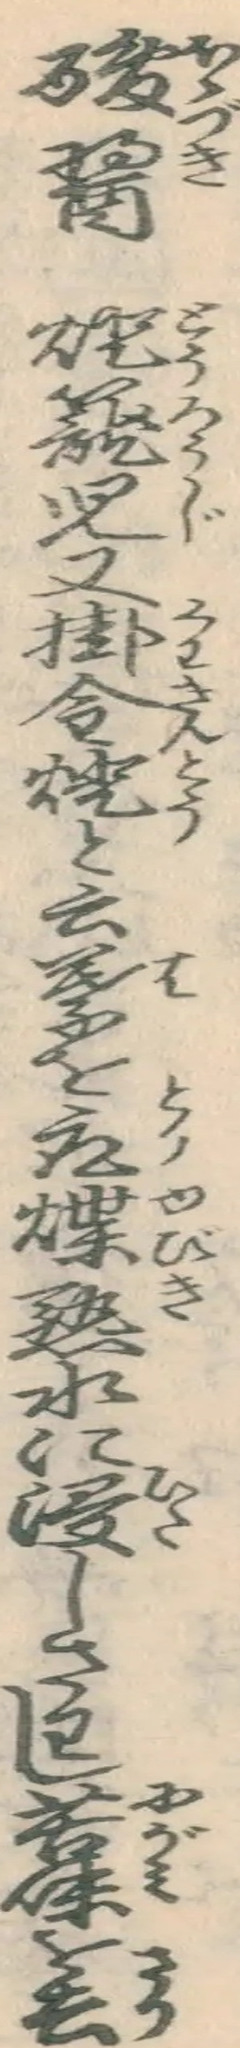酸醤燈篭児又掛金燈と云葉を取煠熟水に浸しさわし苦味を去
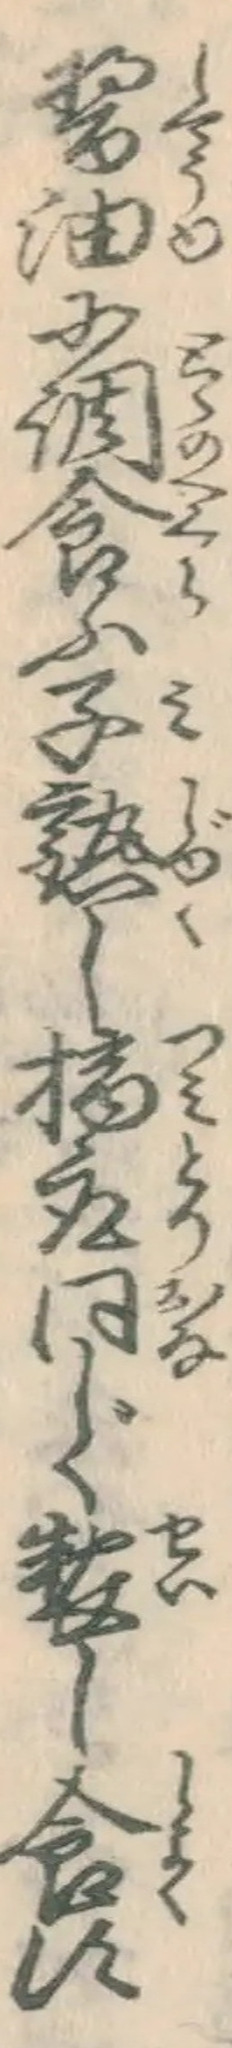醤油に調食ふ子熟し摘取同じく製し食す
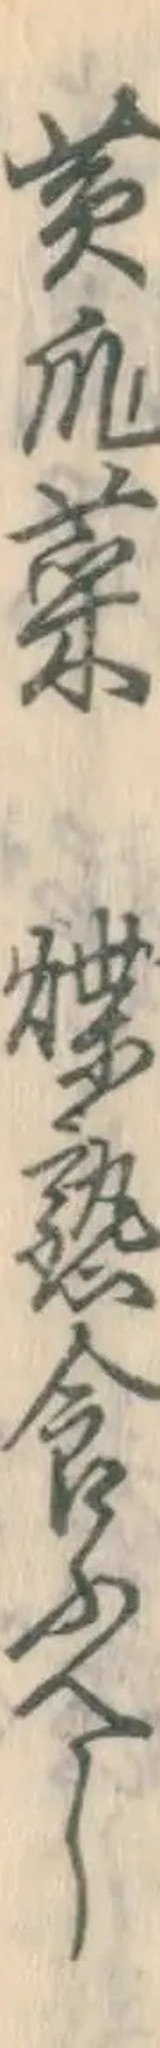黄瓜菜煠熟食ふへし
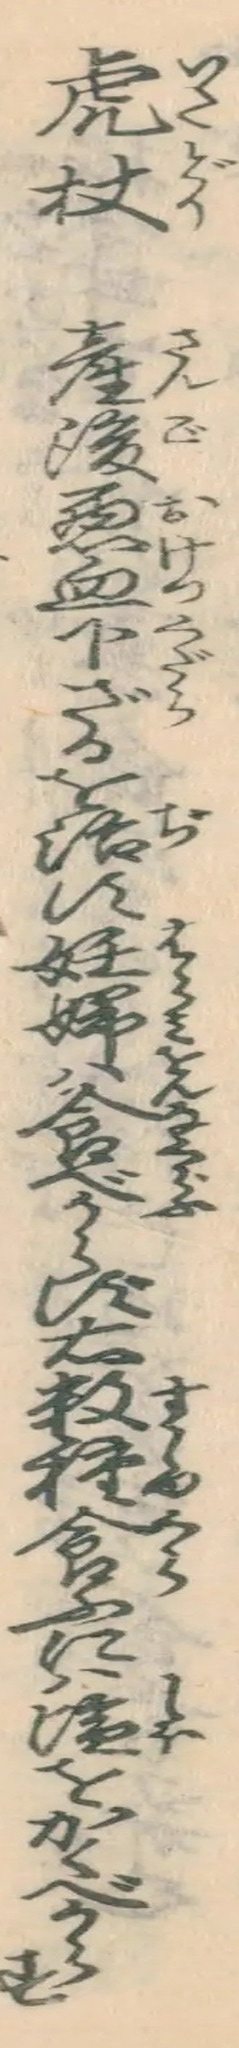虎杖産後悪血下ざるを治す妊婦は食べからず右数種食ふには塩をかくべからす
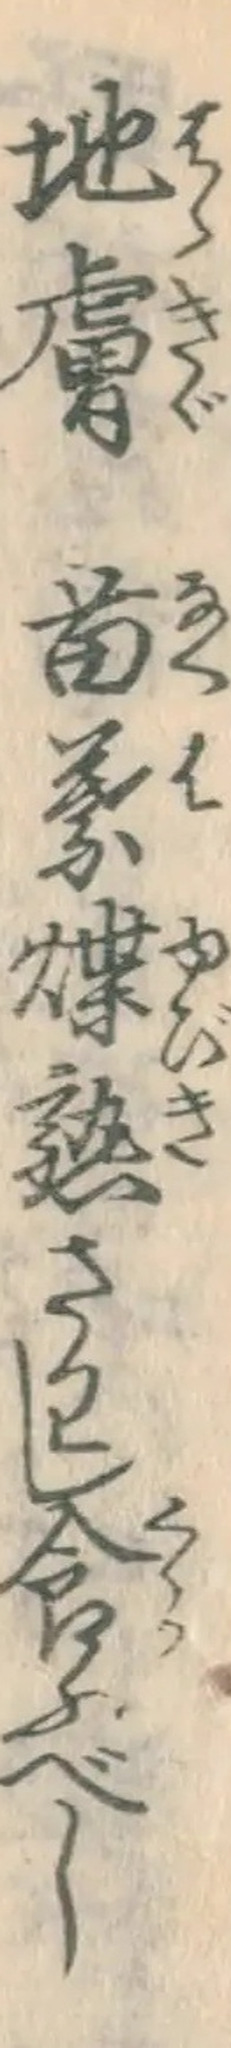地膚苗葉煠熟さわし食ふべし
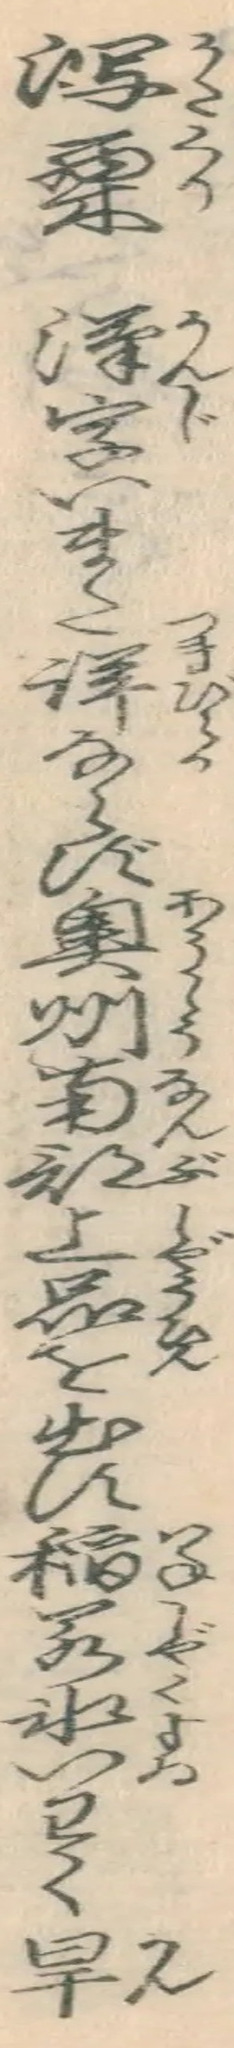潟栗漢字いまた詳ならず奥州南部上品を出す稲若水いわく旱
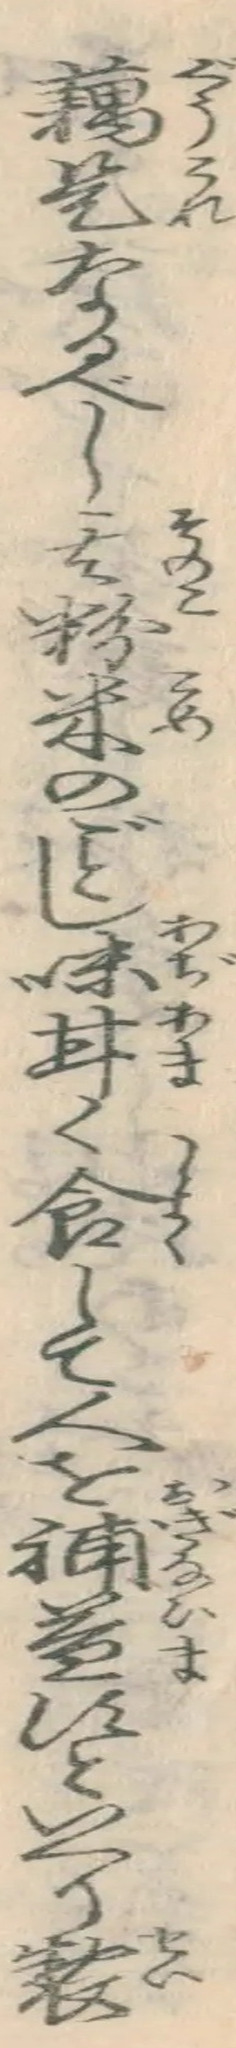藕是なるべし其粉米のごとし味甘く食して人を補益すといへり製
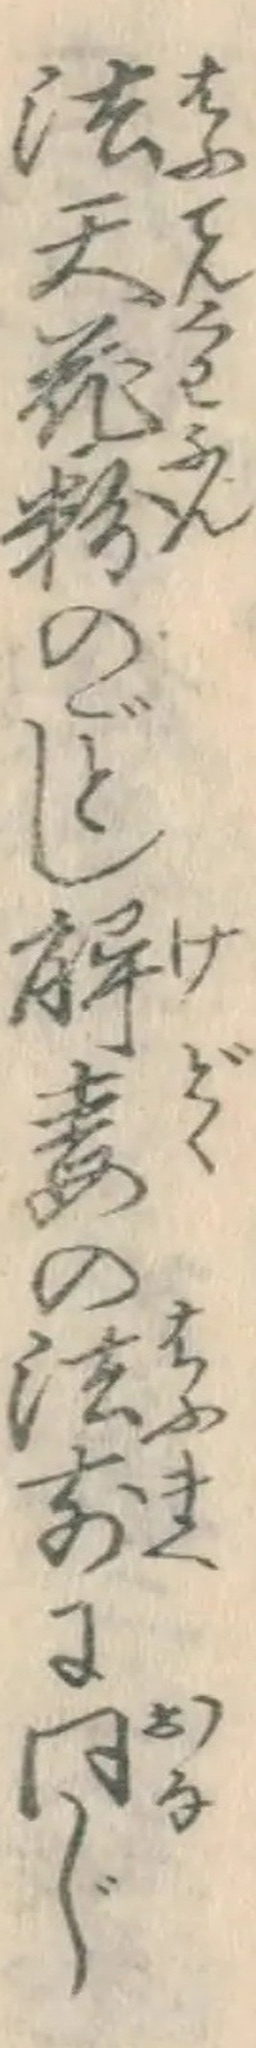法天花粉のごとし解毒の法前に同じ
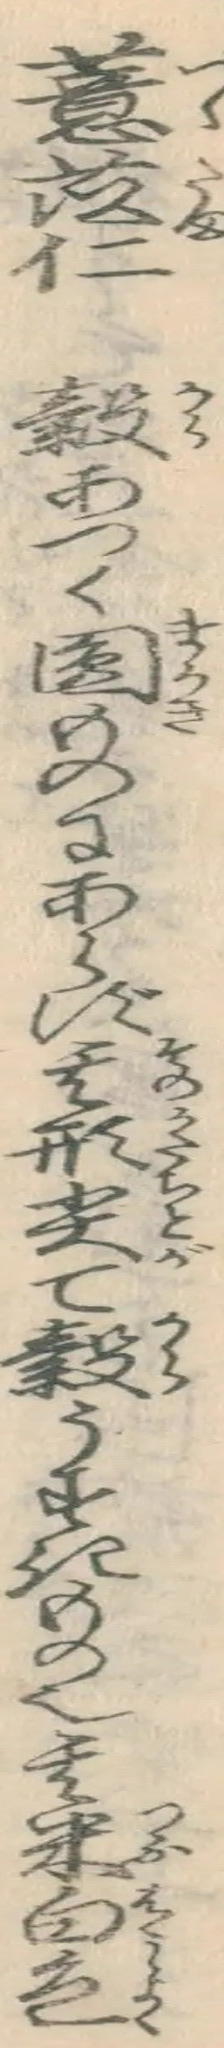薏茨仁殻あつく圓ものにあらず其形尖て殻うすきもの也其米白色
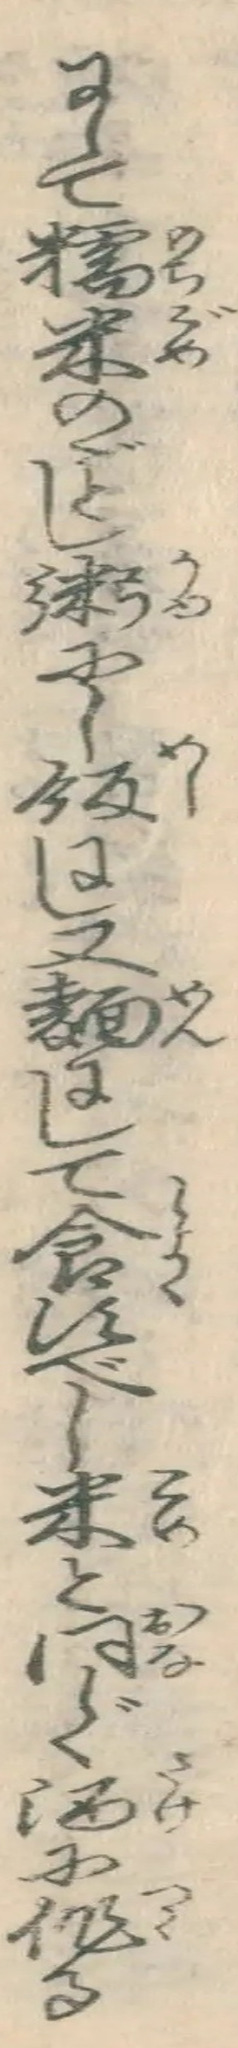にして糯米のごとし粥にし飯にし又麺にして食すべし米と同じく酒に作る
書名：経済をしへ草
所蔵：国立国会図書館 National Diet Library, JAPAN
